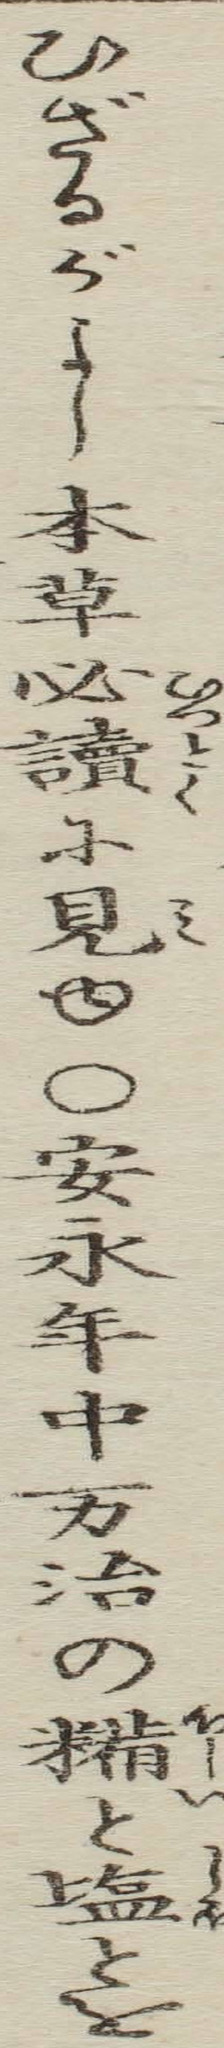ひざるがよし本草必読に見ゆ○安永年中万治の糒と塩とを
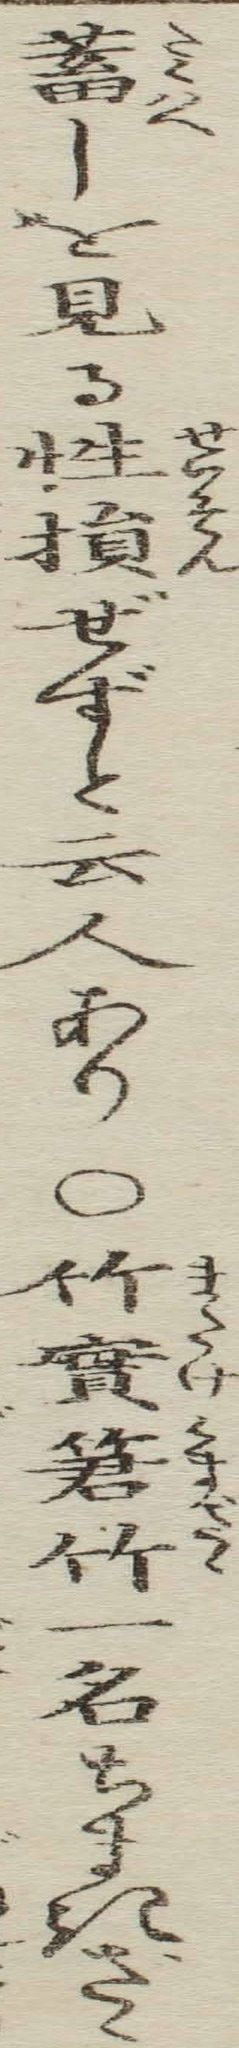蓄しを見る性損ぜずと云人あり○竹實䇹竹一名ちまきさゝ
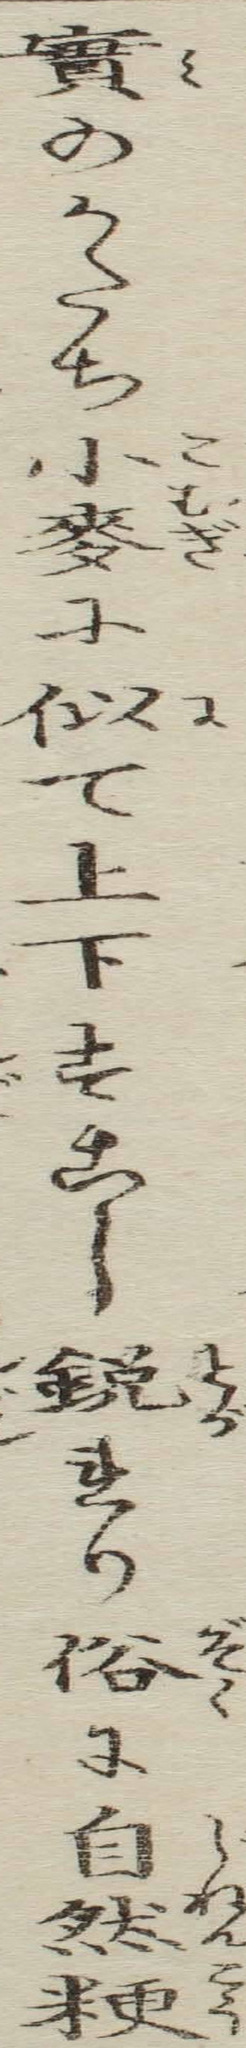實のかたち小麦に似て上下すこし鋭れり俗に自然粳
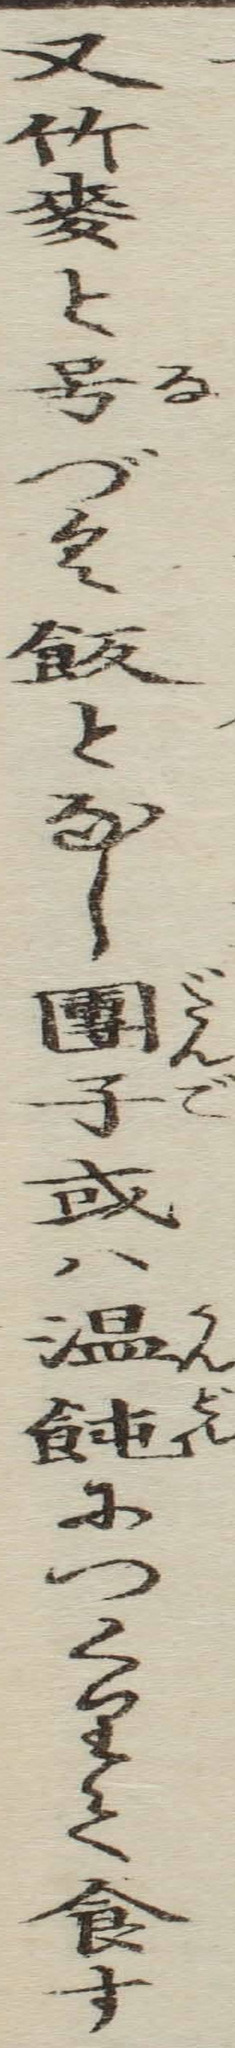又竹麦と号づく飯となし団子或は饂飩につくりて食す

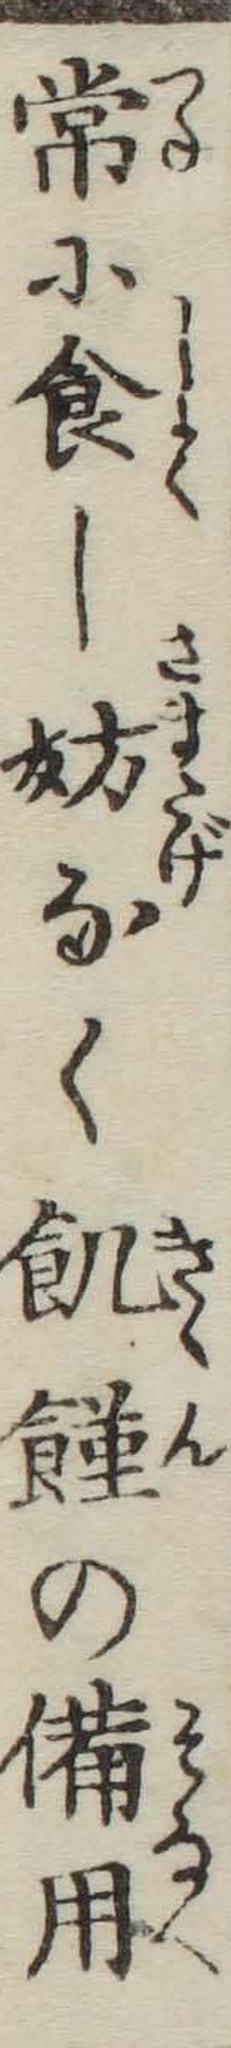常に食し妨なく飢饉の備用
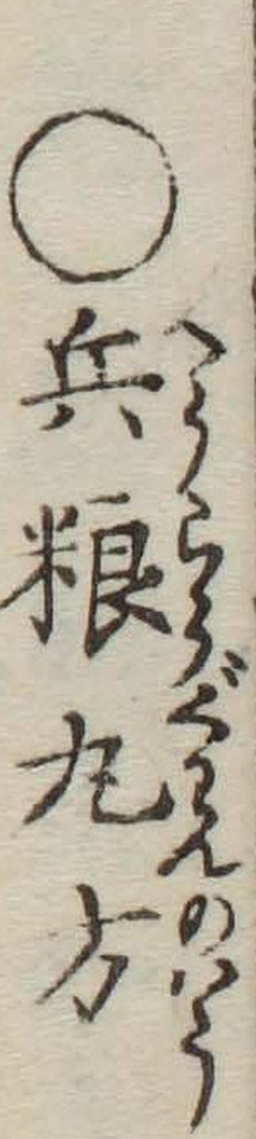○兵粮丸方
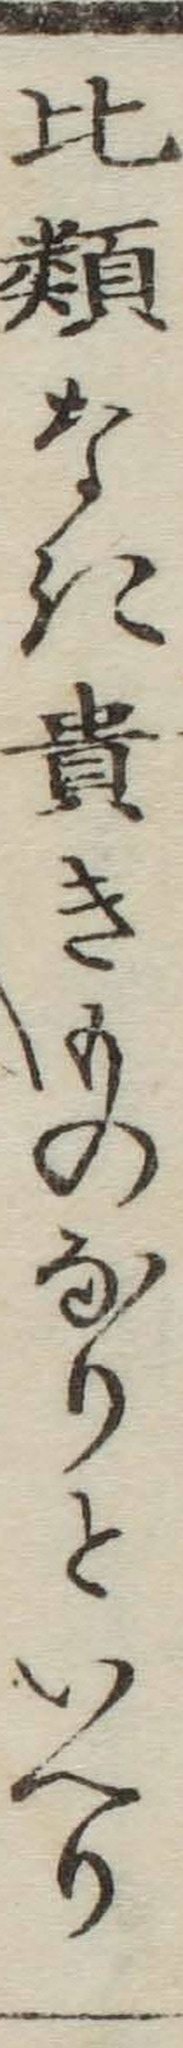比類なき貴きものなりといへり
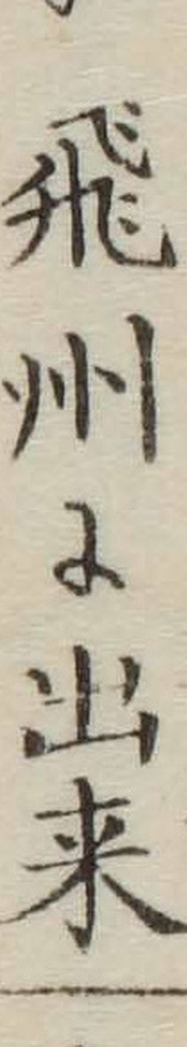飛州に出来
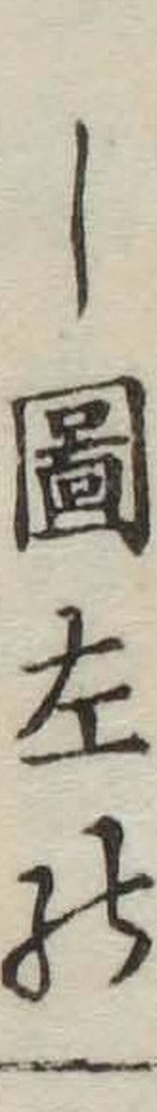し図左の
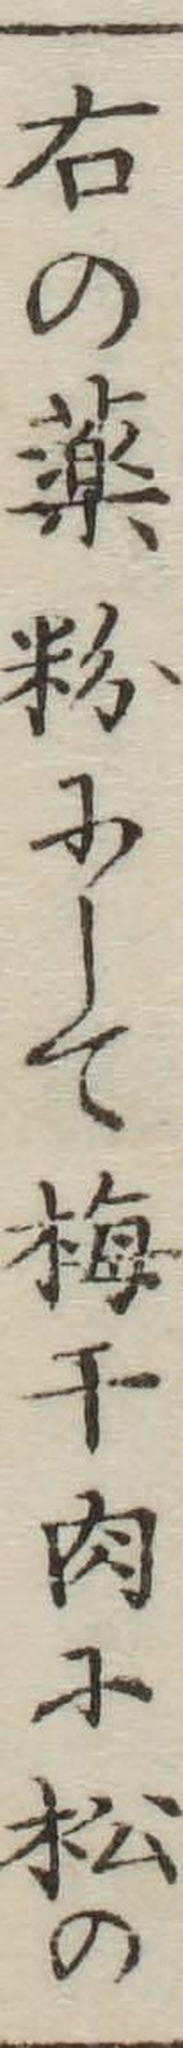右の薬粉にして梅干肉に松の
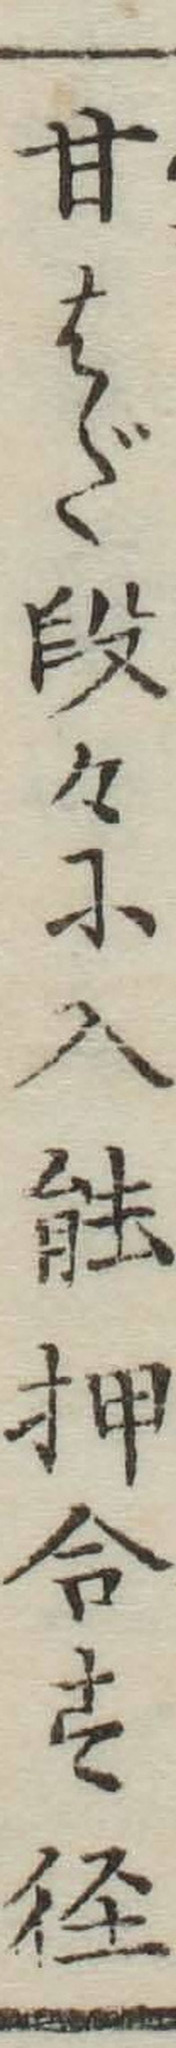甘はだ段々に入能押合す径
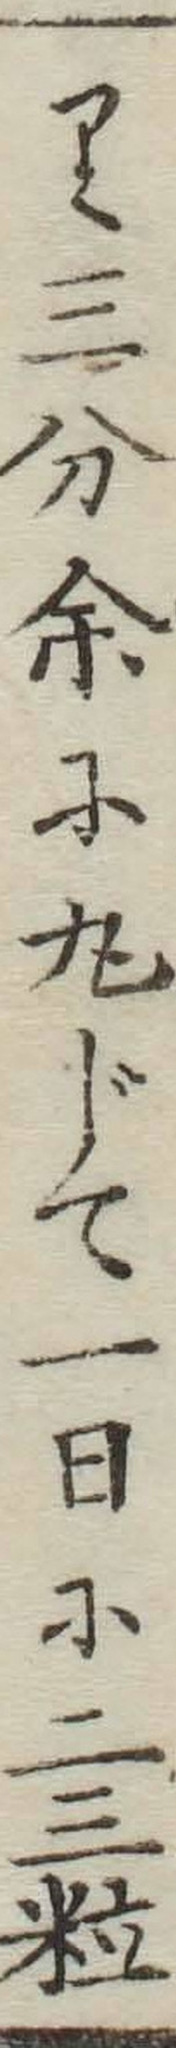り三分余に丸じて一日に二三粒
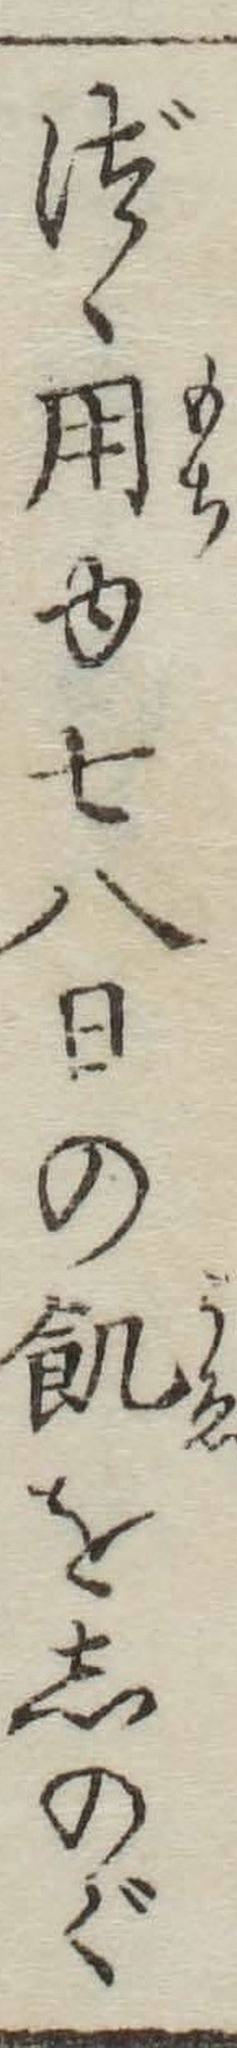づゝ用ゆ七八日の飢をしのぐ
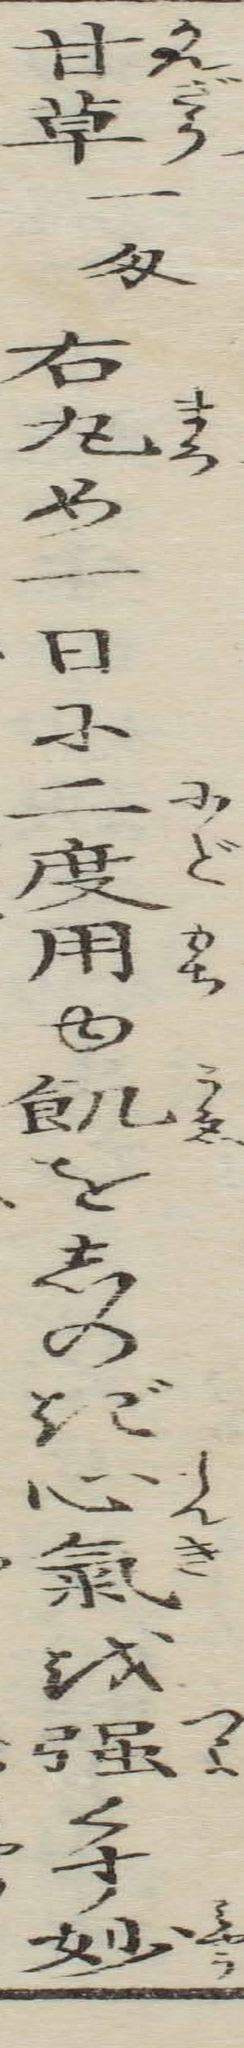甘草一匁右丸め一日に二度用ゆ飢をしのぎ心気を強くす妙
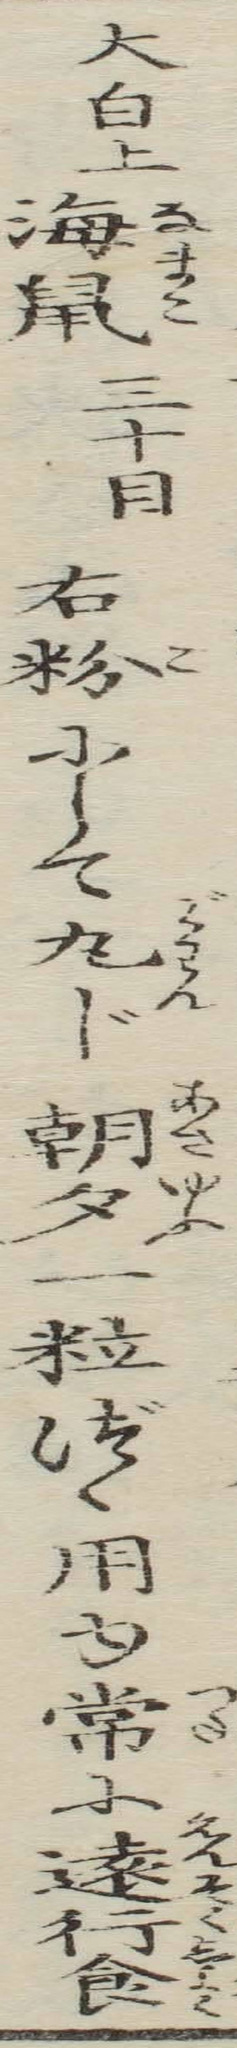大白上海䑕三十目右粉にして丸じ朝夕一粒づゝ用ゆ常に遠行食
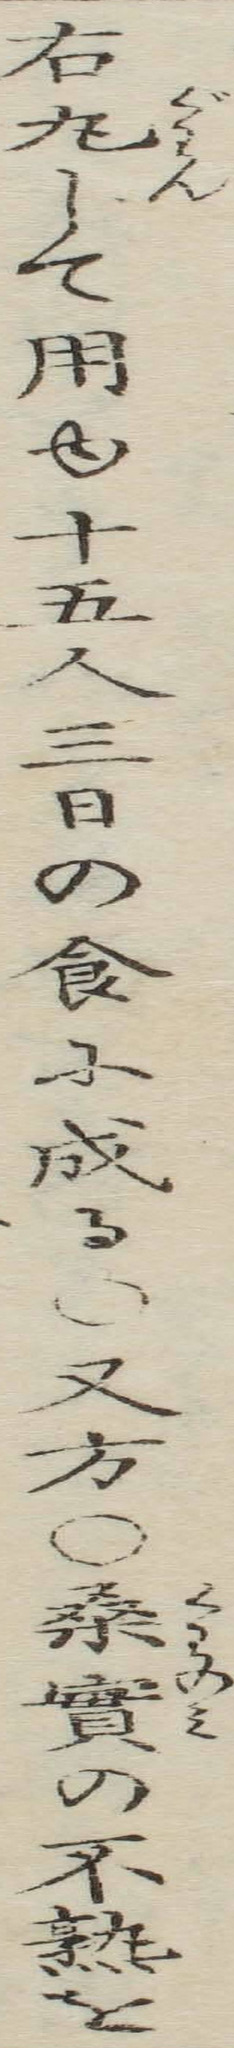右丸して用ゆ十五人三日の食に成る○又方○桑實の不熟を
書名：救荒便覧
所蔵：国文学研究資料館
